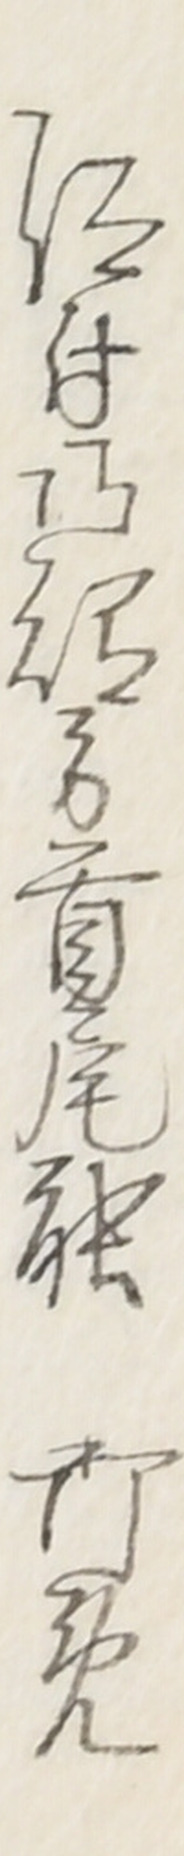仰付御賄方首尾能仰付
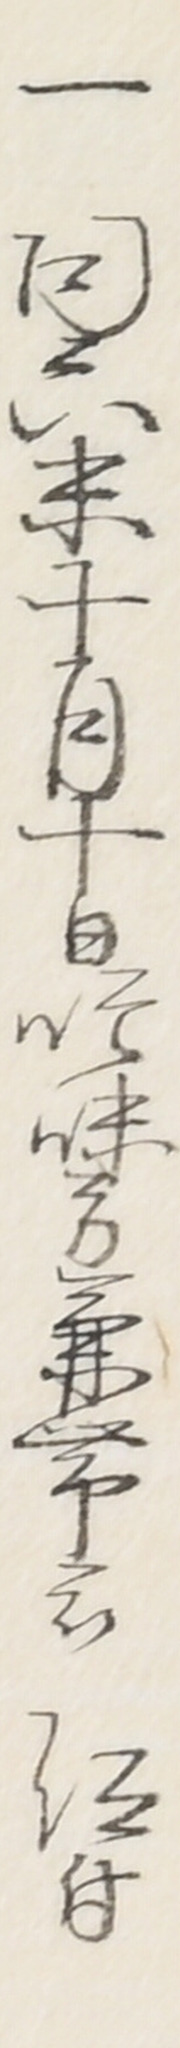一同六未十月十日吟味兼帯被仰付
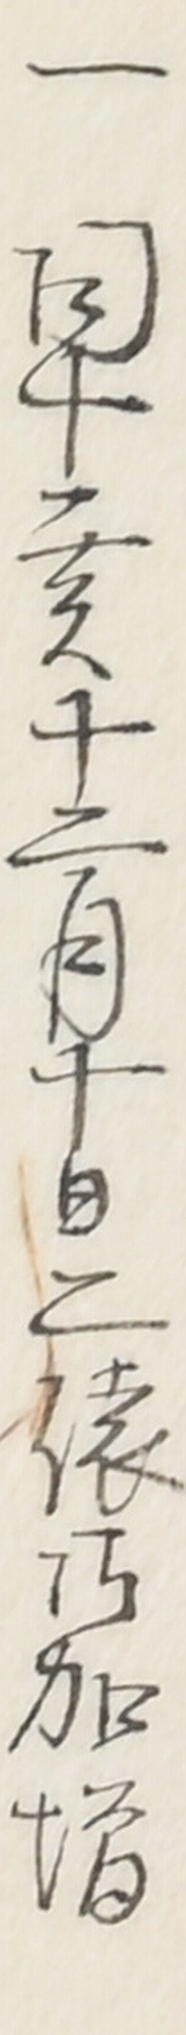一同十亥十二月十日二俵御加増
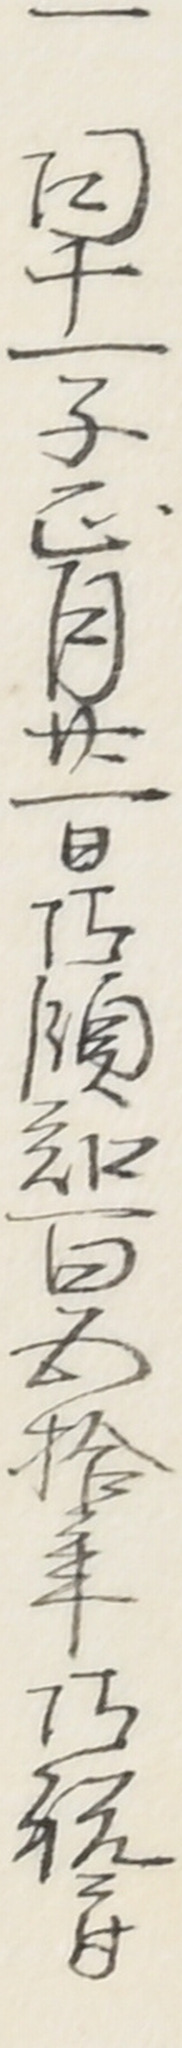一同十一子正月廿一日御領知百五拾年御祝ニ付
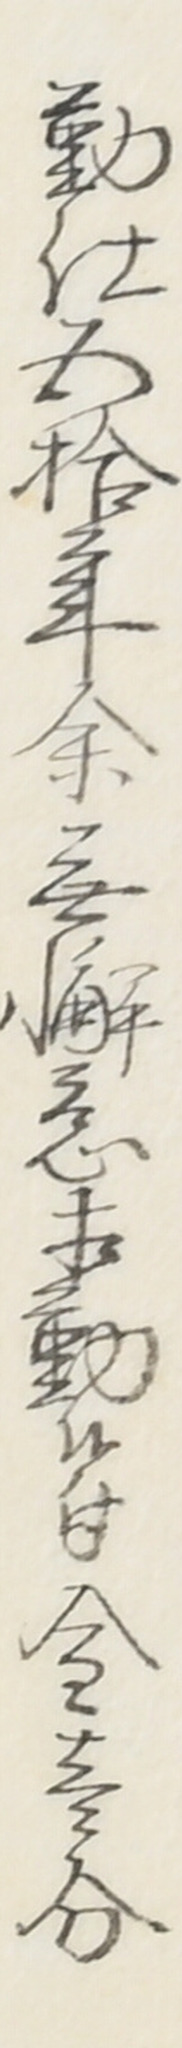勤仕五拾年余無懈怠相勤候付金壱分
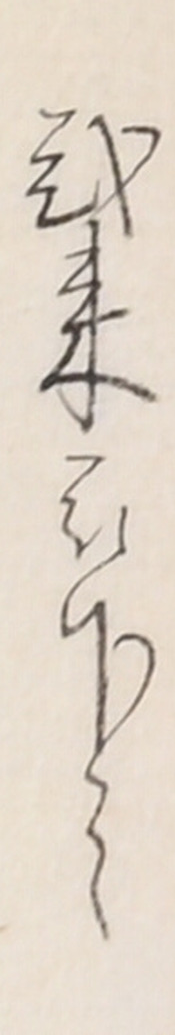弐朱被下之
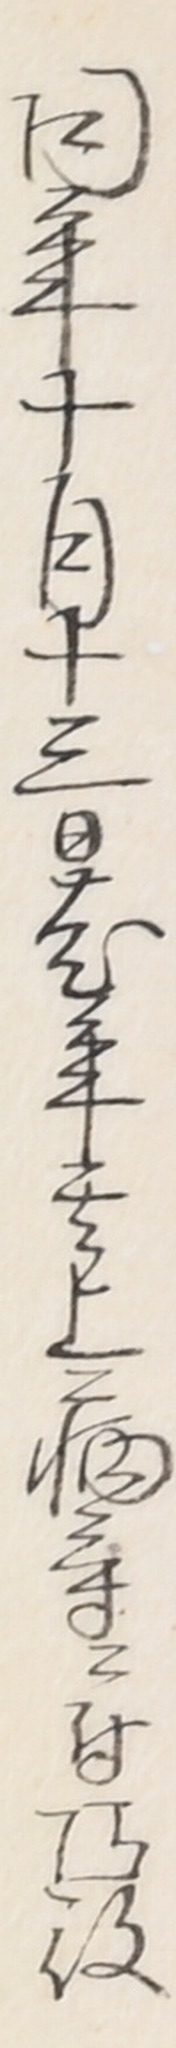一同年十月十三日老年其上病気ニ付御役
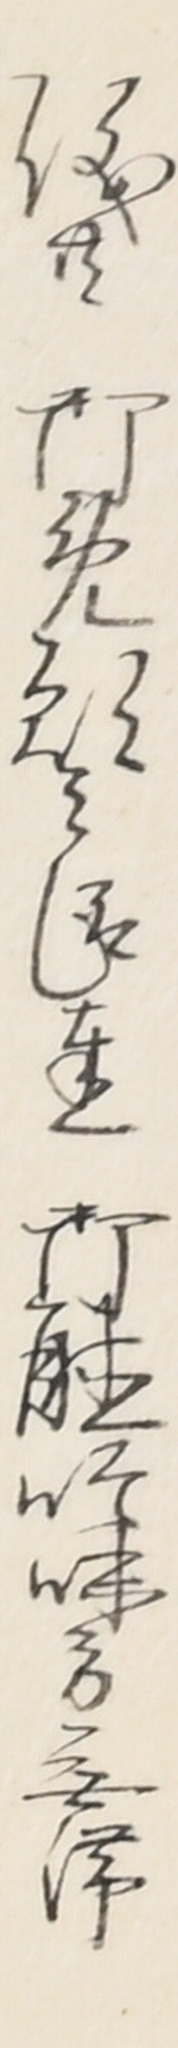儀共御免願之趣達御聴吟味方無滞
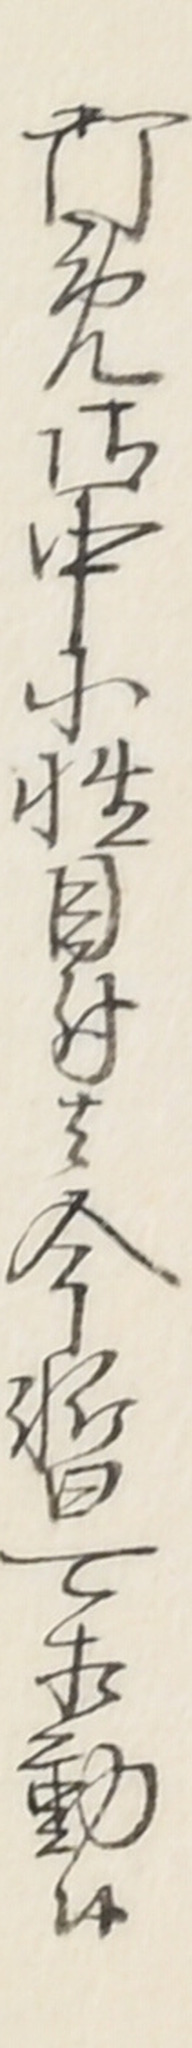御免御中小性目付者今暫可相勤候
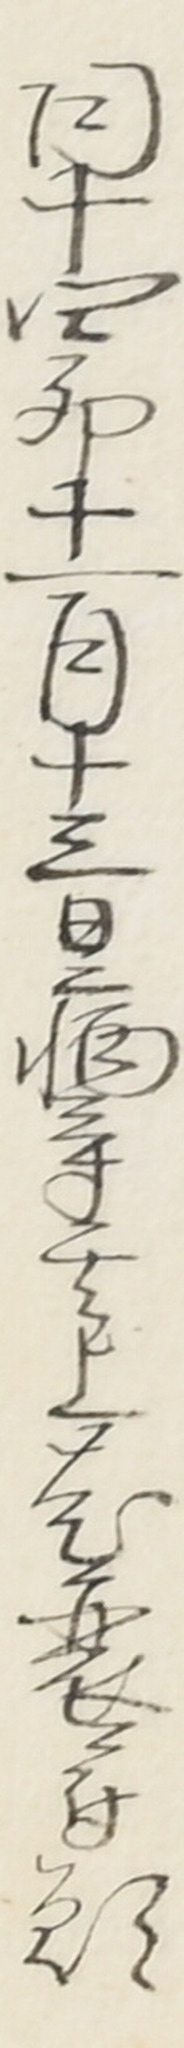一同十四卯十一月十三日病気其上老衰ニ付願
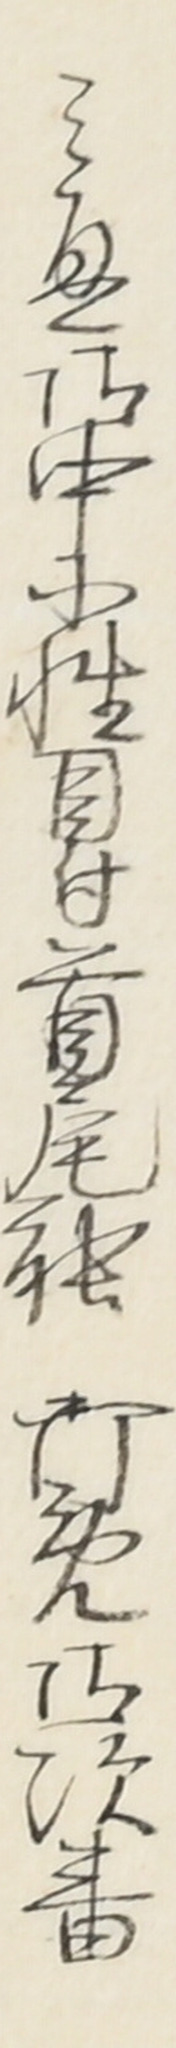之通御中小性目付首尾能御免御次番
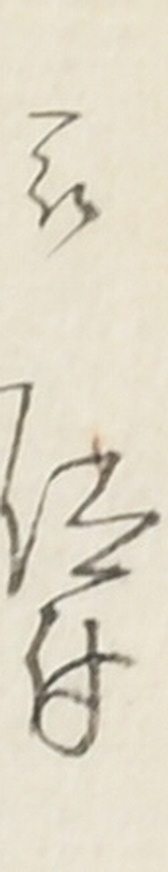被仰付
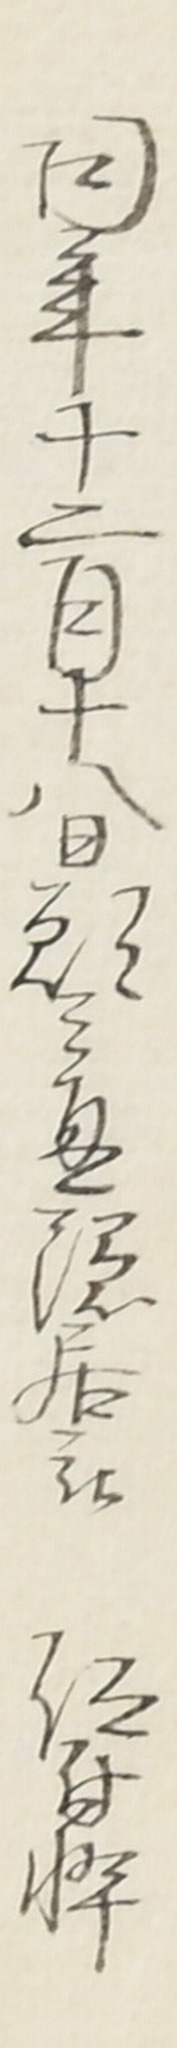一同年十二月十八日願之通隠居被仰付忰
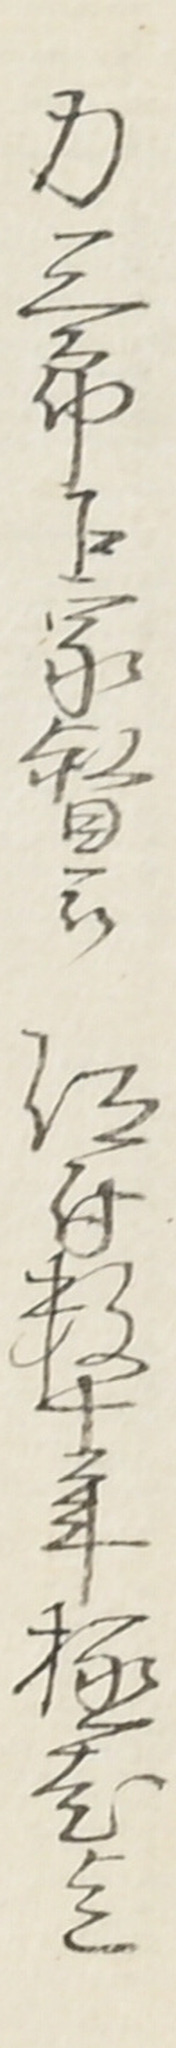力三郎江家督被仰付数十年極老迄
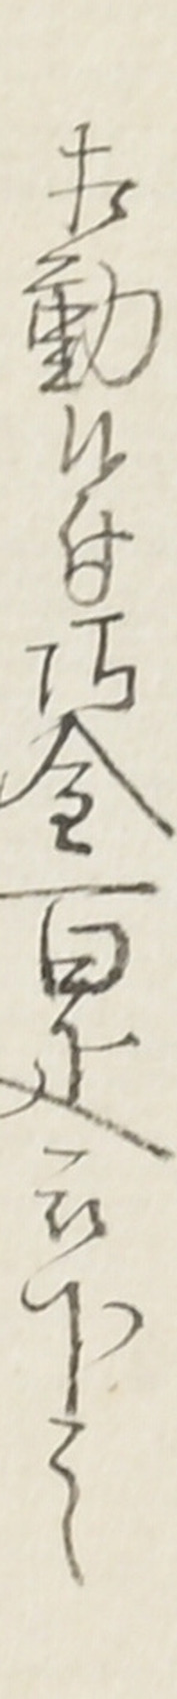相勤候付御金百疋被下之
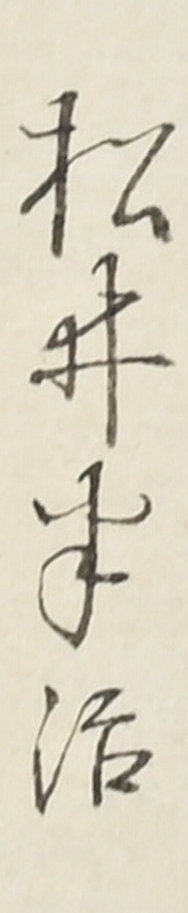松井半治
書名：無足諸士勤仕録（四）
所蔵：伊那市立高遠町図書館・合同会社AMANE
